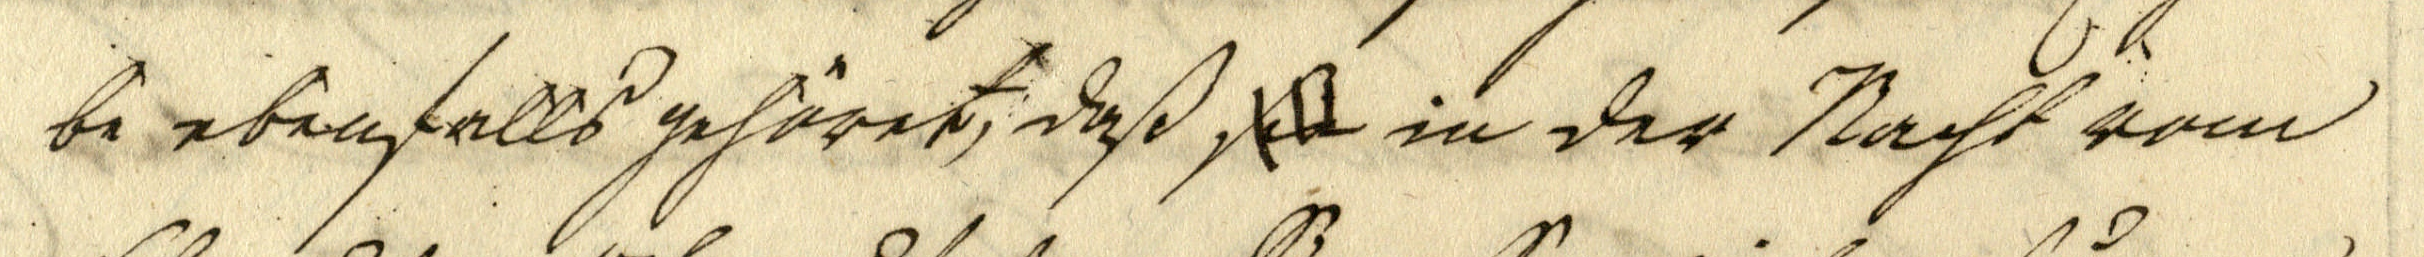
be ebenfalls gehöret, daß sie in der Nacht vom
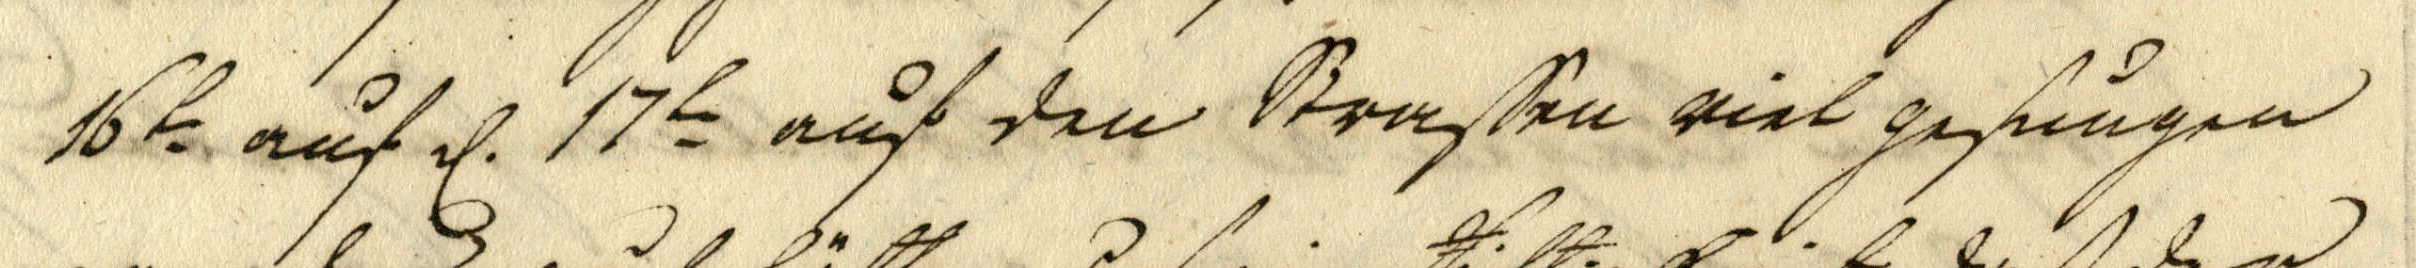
16ten auf d. 17ten auf den Strassen viel gesungen
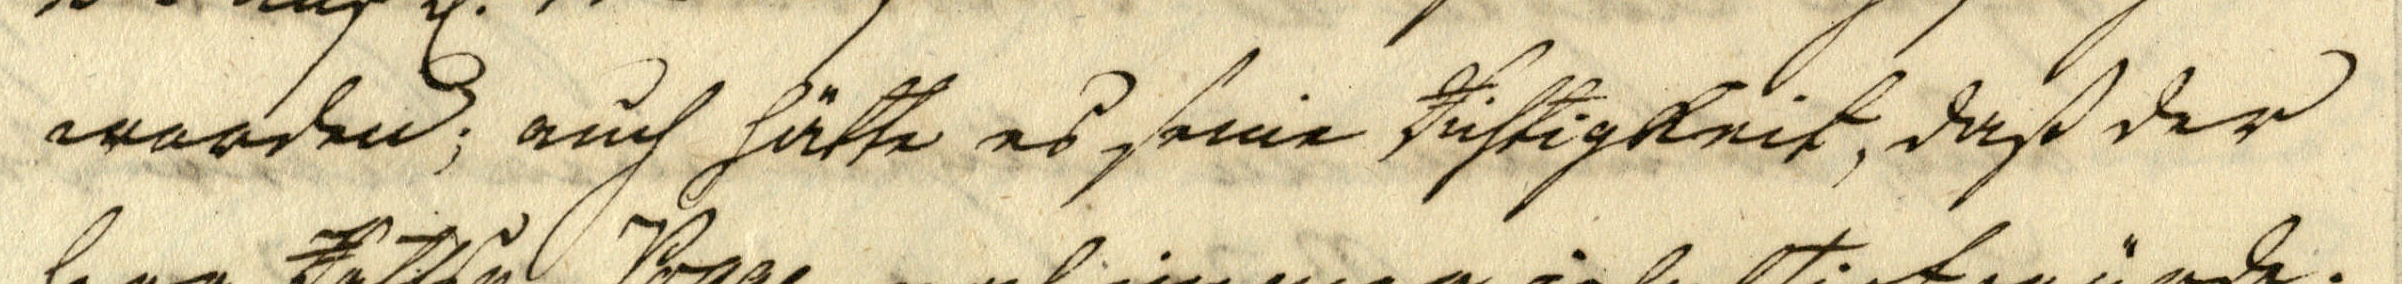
worden; auch hätte es seine Richtigkeit, daß der
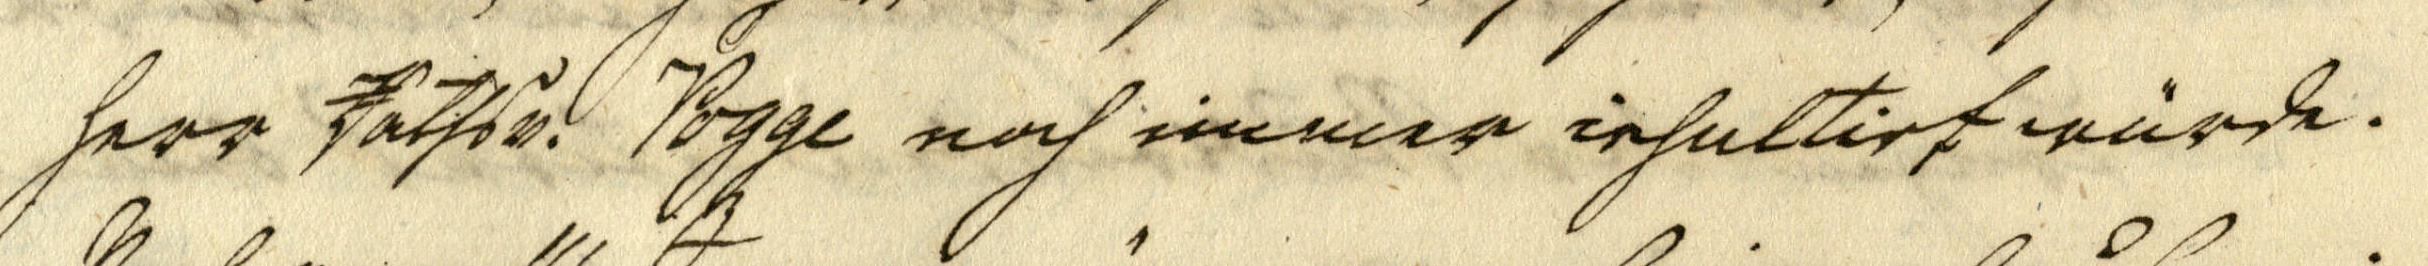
Herr Rathsv. Pogge noch immer insultirt würde.
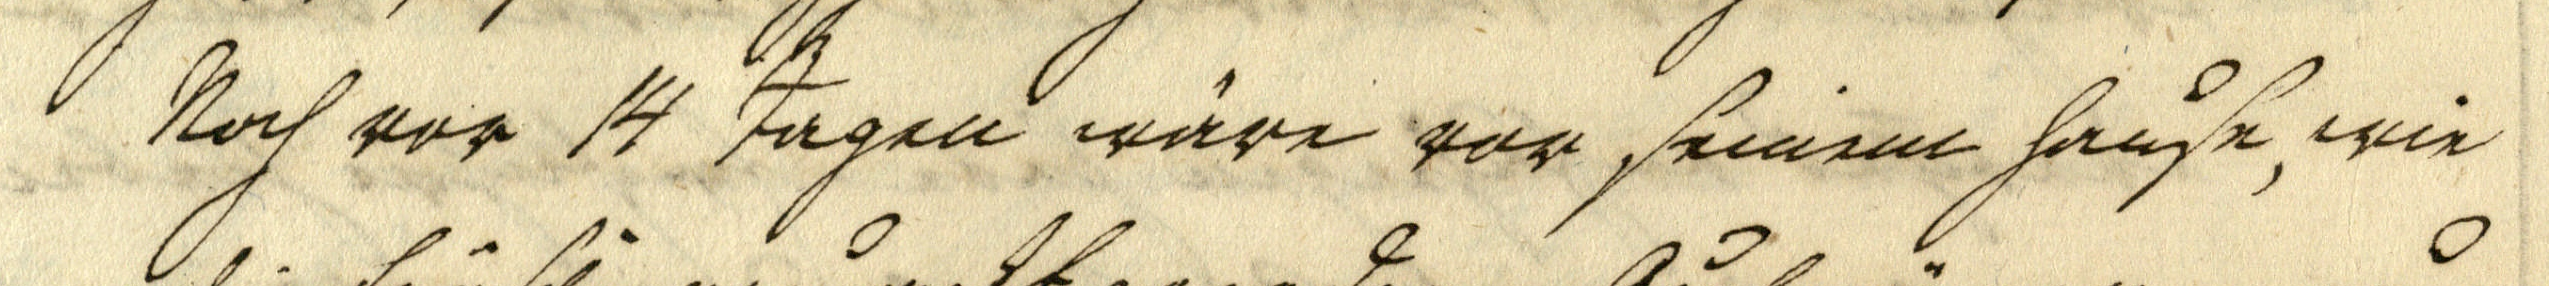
Noch vor 14 Tagen wäre vor seinem hause, wie
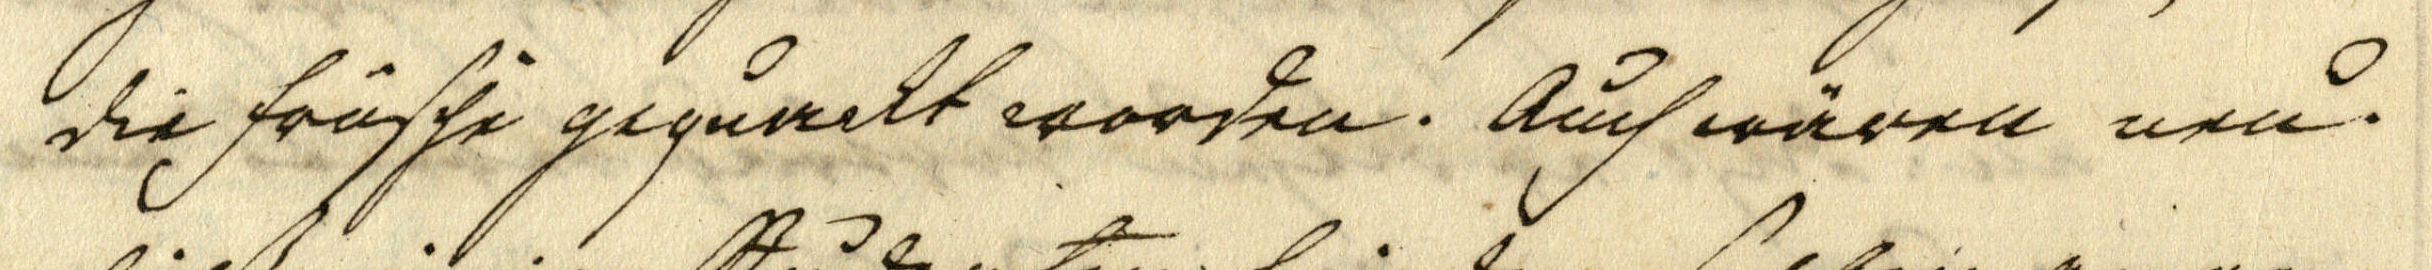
die Frösche gequackt worden. Auch wären neu-
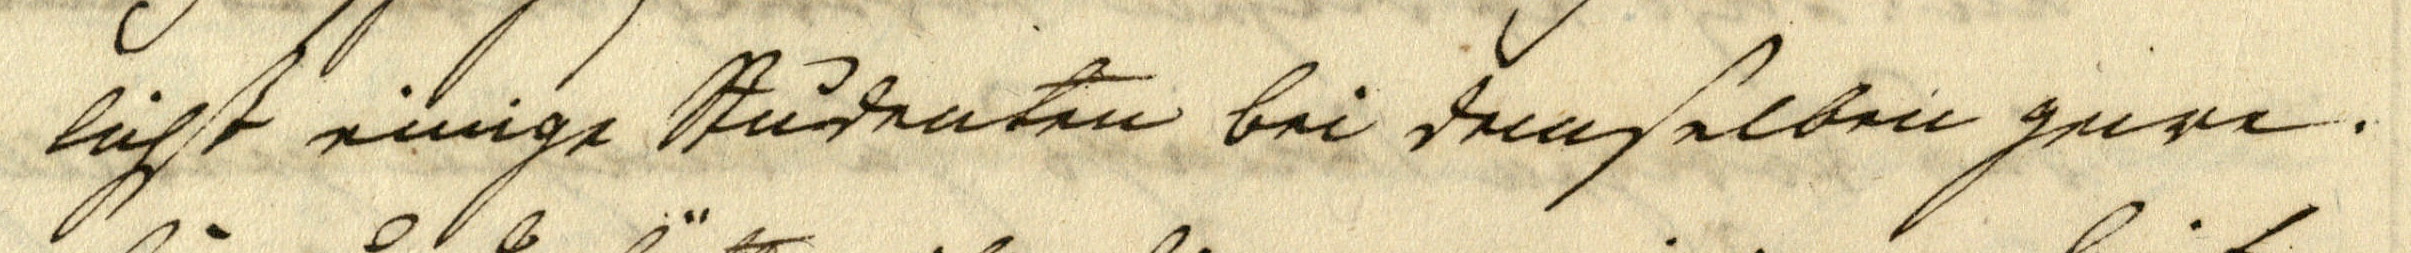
licht einige Studenten bei demselben gewe-
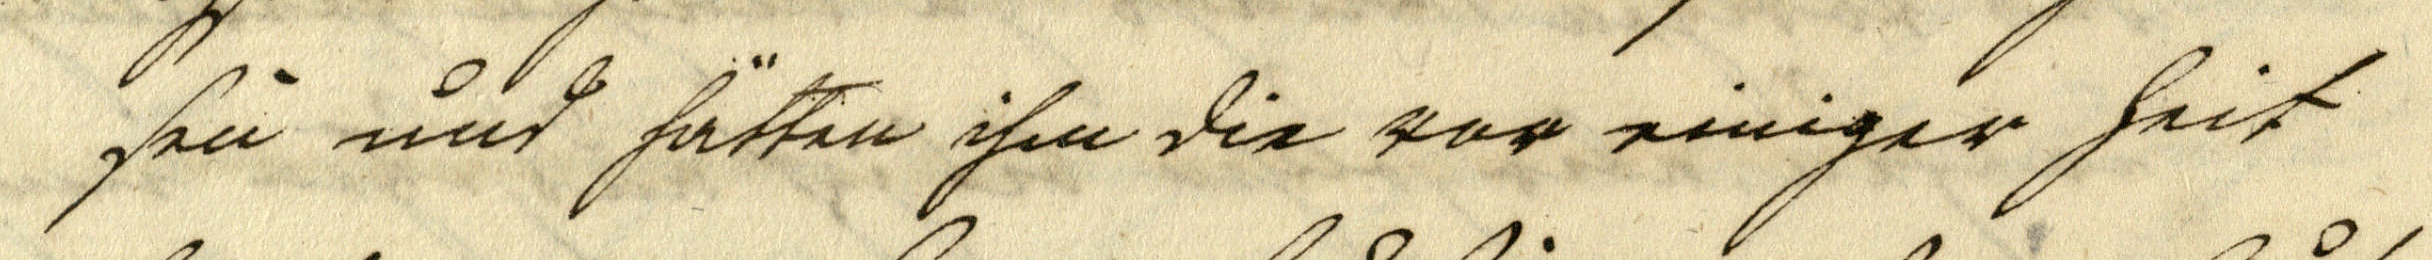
sen und hätten ihm die vor einiger Zeit
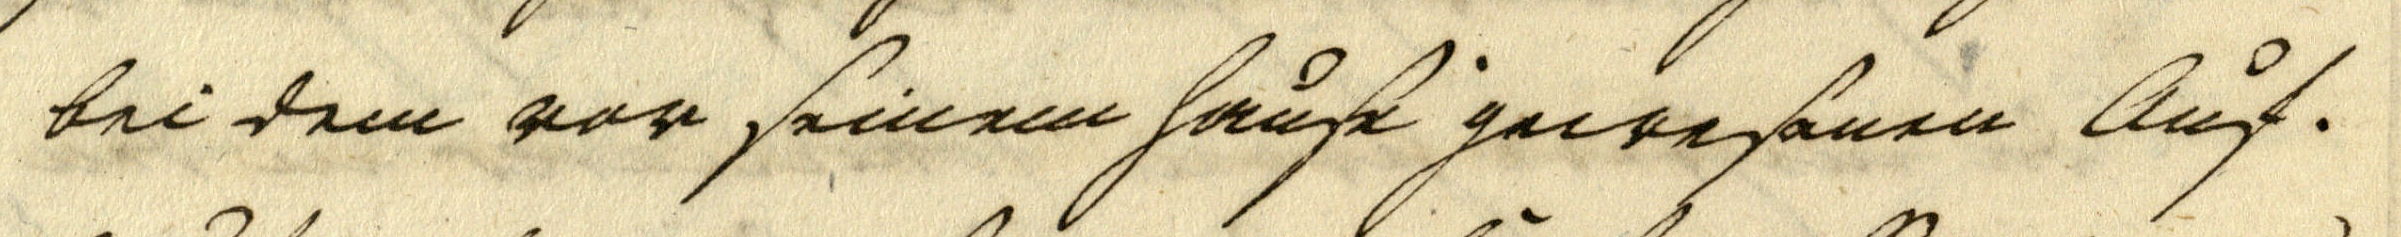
bei dem vor seinem hause gewesenen Auf-
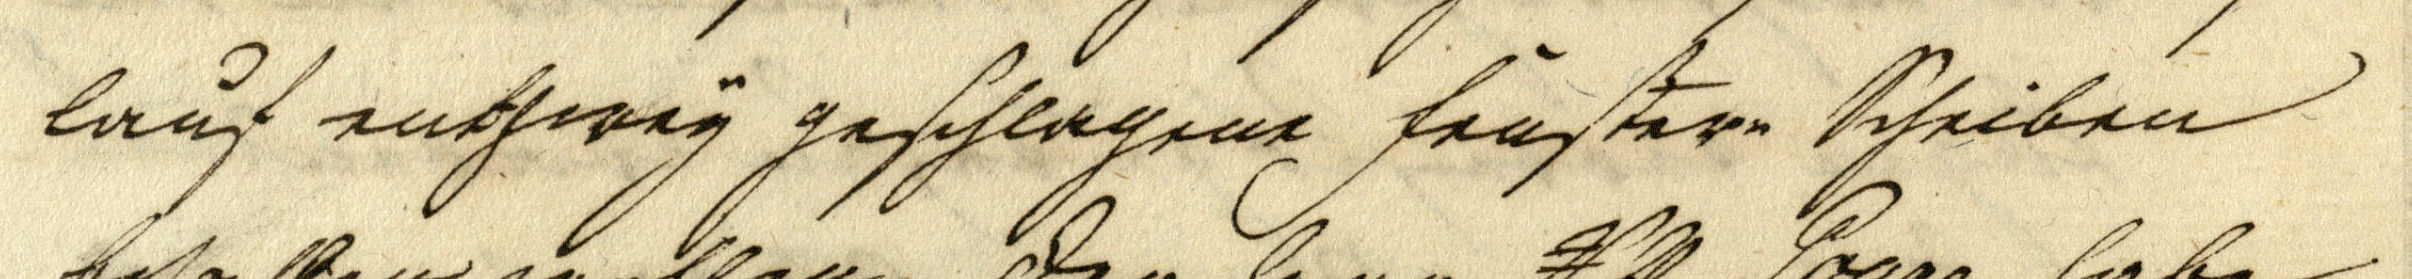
lauf entzwey geschlagene Fenster Scheiben
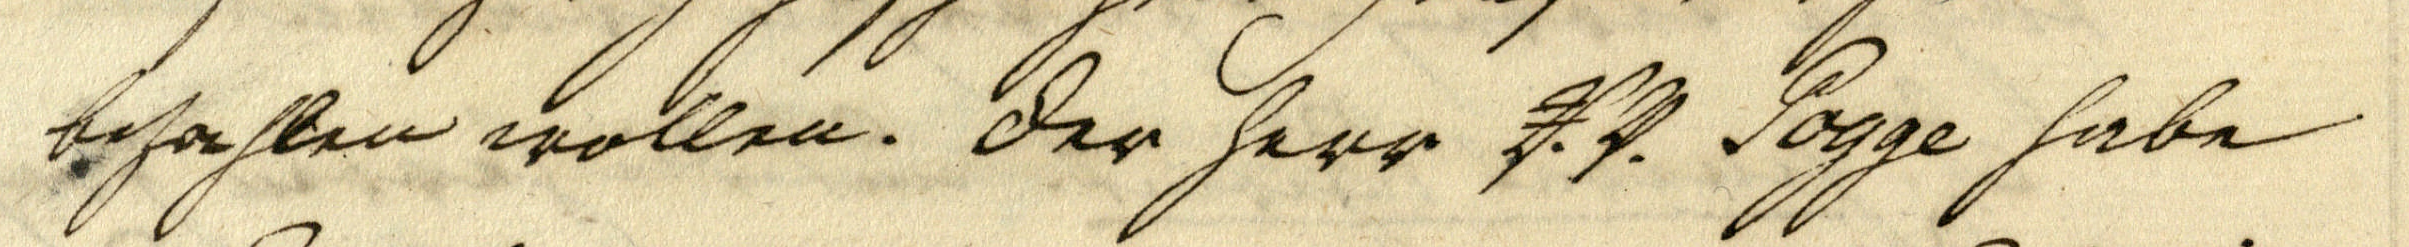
bezahlen wollen. Der Herr R. V. Pogge habe
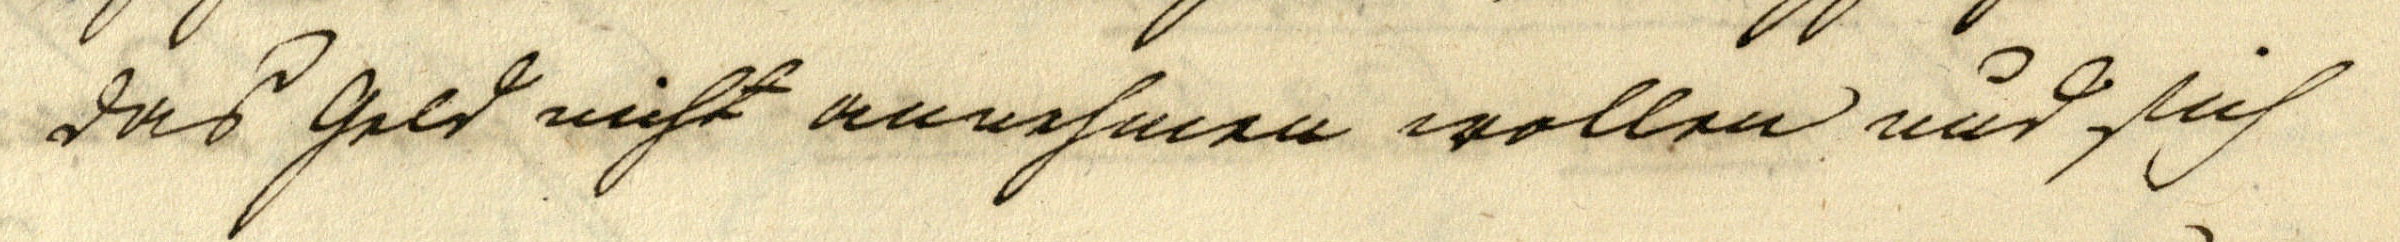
das Geld nicht annehmen wollen und sich
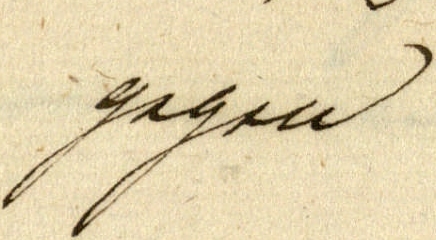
gegen
